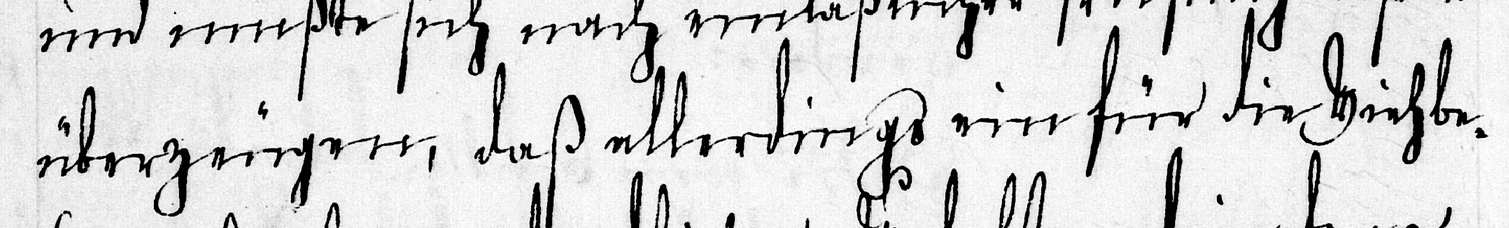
überzeugen, daß allerdings ein für die Viehbe¬
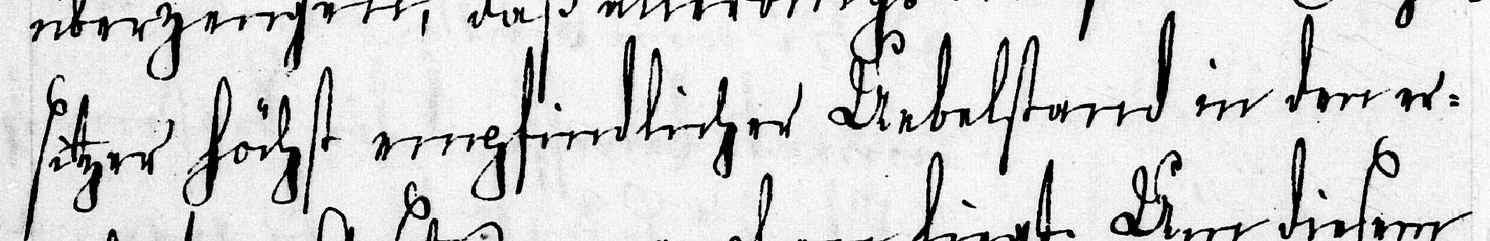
sitzer höchst empfindlicher Uebelstand in den er¬
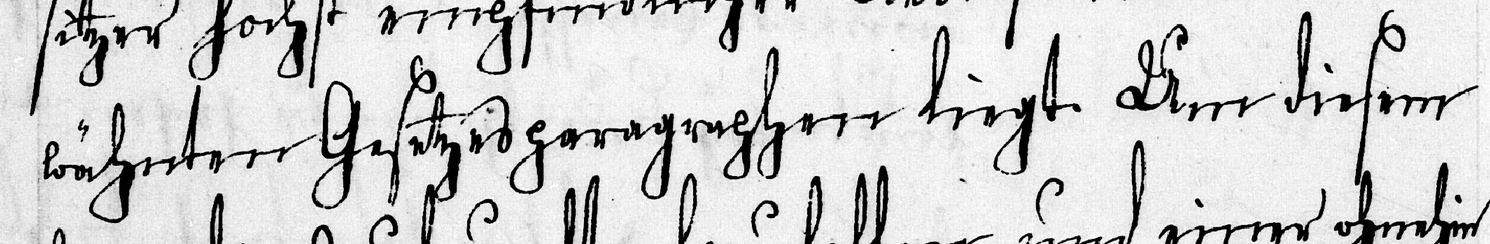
wähnten Gesetzesparagraphen liegt. Um diesem
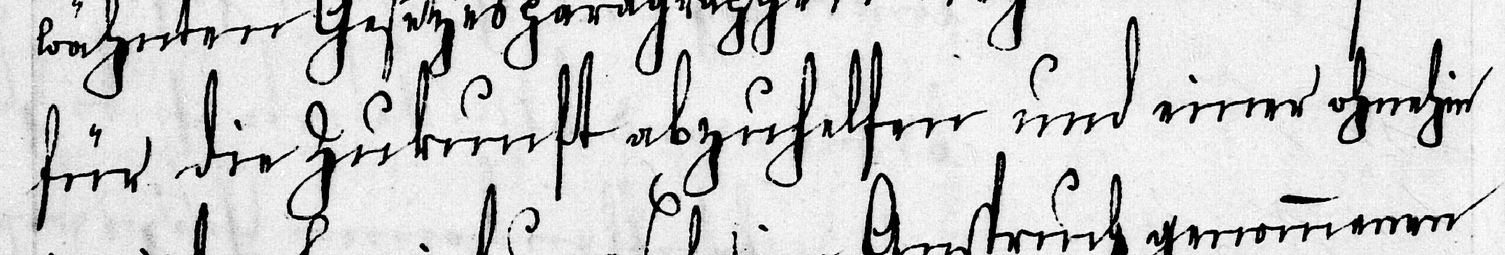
für die Zukunft abzuhelfen und einer ohnehin
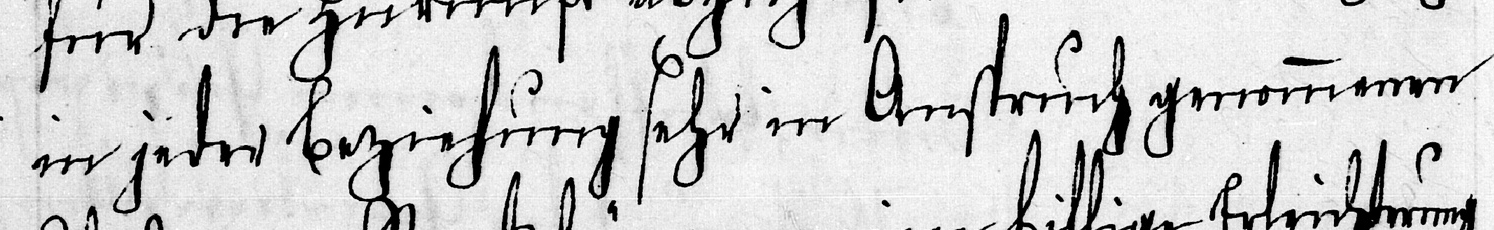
in jeder Beziehung sehr in Anspruch genommenen
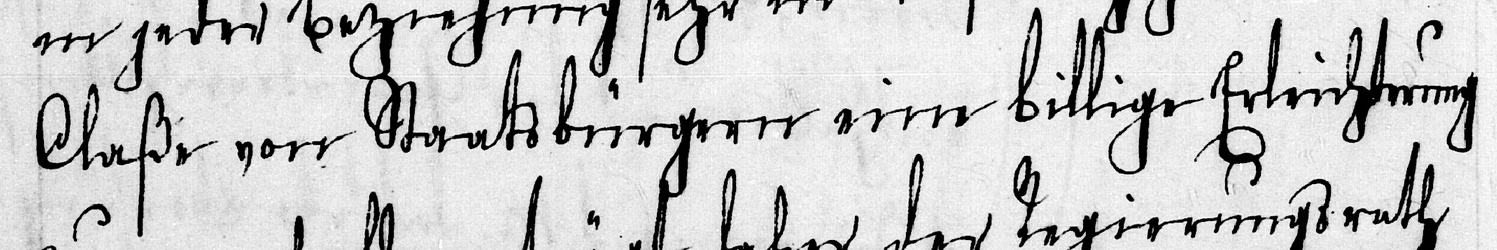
Claße von Staatsbürgern eine billige Erleichterung
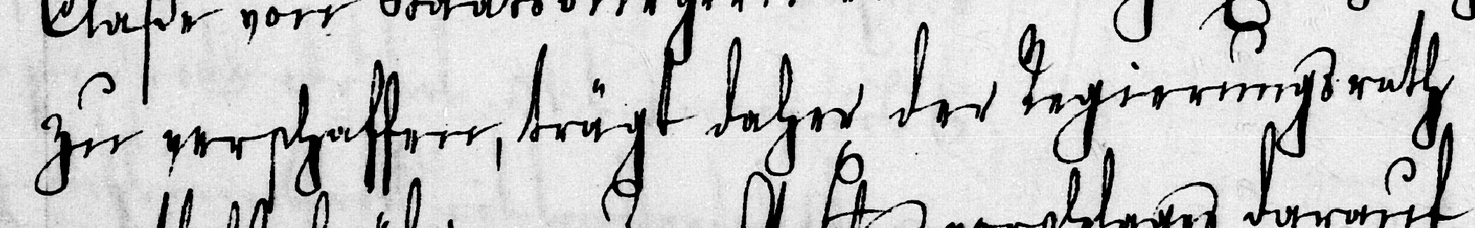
zu verschaffen, trägt daher der Regierungsrath
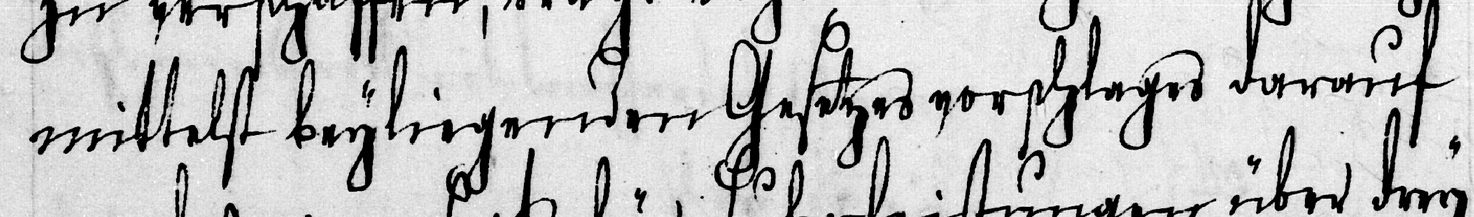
mittelst beyliegenden Gesetzesvorschlages darauf
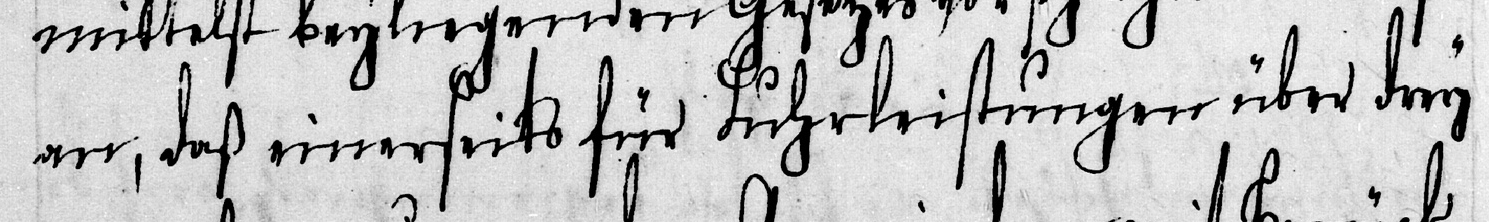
an, daß einerseits für Fuhrleistungen über drey
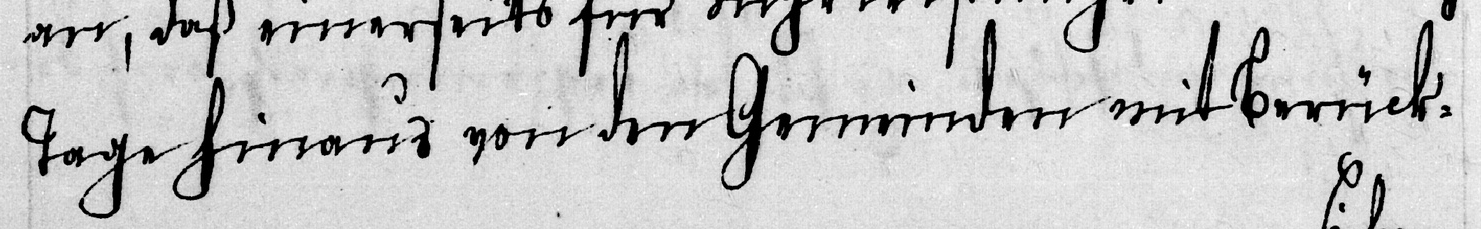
Tage hinaus von den Gemeinden mit Berück-
